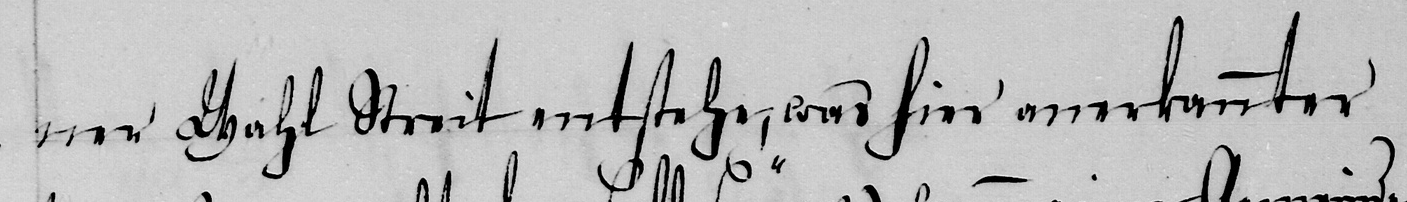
ner Wahl Streit entstehe, was hier anerkannter
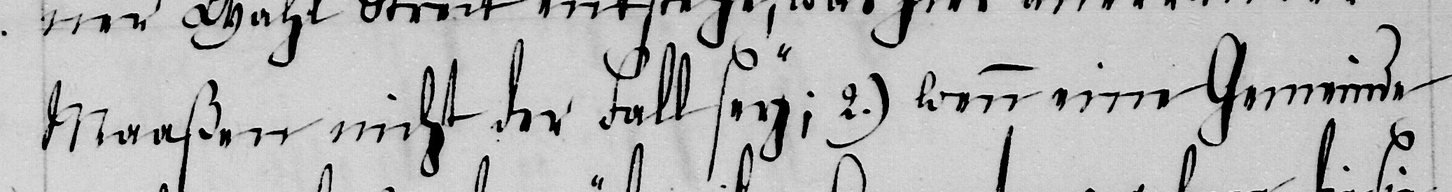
Maaßen nicht der Fall sey; 2.) wenn eine Gemeinde
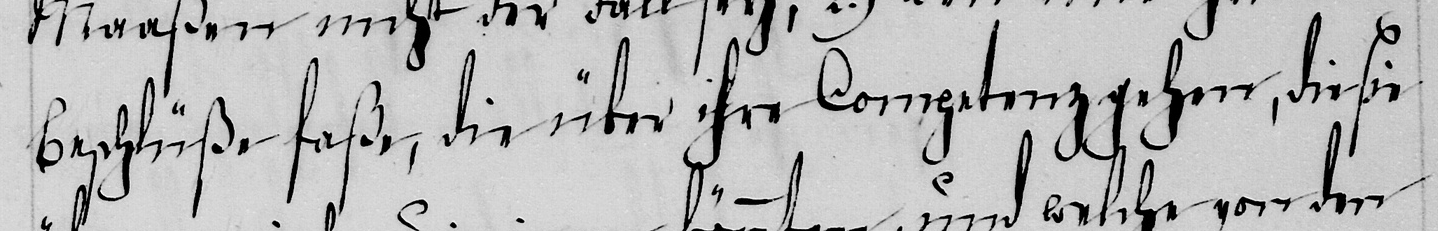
Beschlüße faße, die über ihre Competenz gehen, die sie
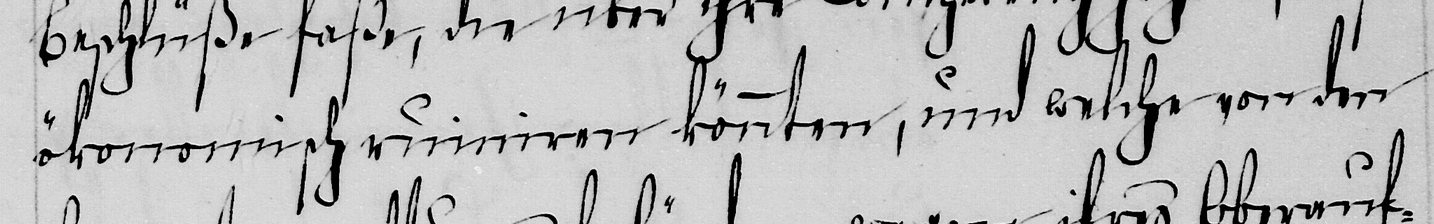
ökonomisch ruiniren könnten, und welche von den
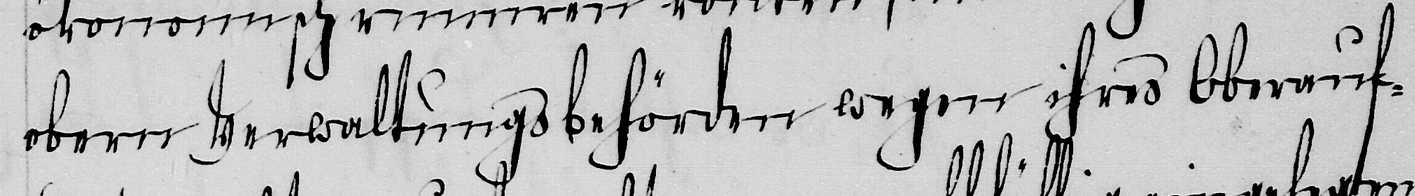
obern Verwaltungsbehörden wegen ihres Oberauf¬
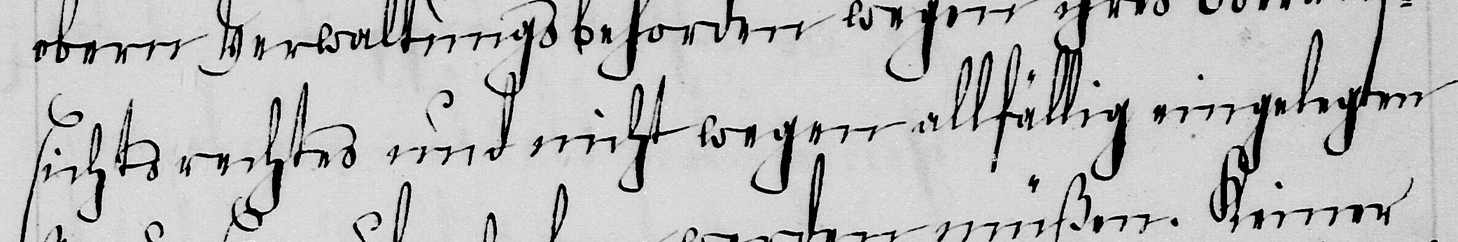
sichtsrechtes und nicht wegen allfällig eingelegten
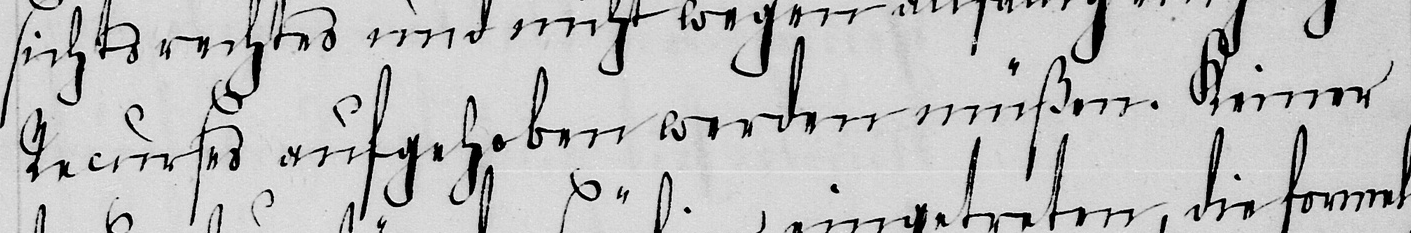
Recurses aufgehoben werden müßen. Keiner
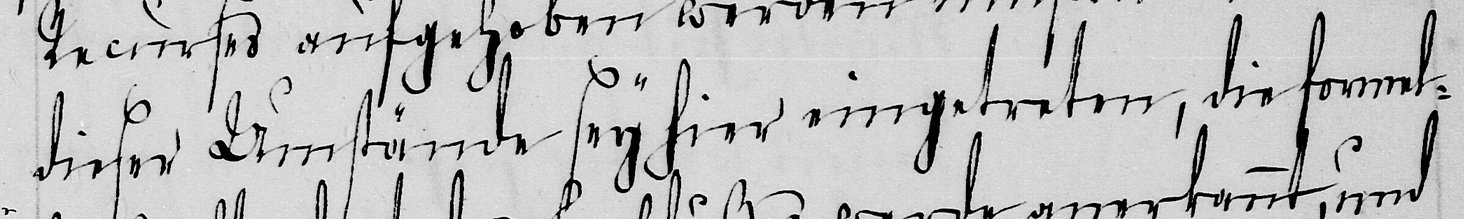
dieser Umstände sey hier eingetreten, die formel¬
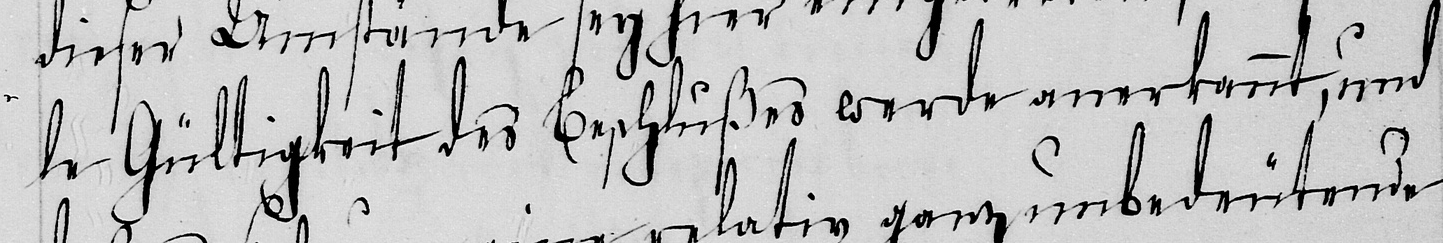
le Gültigkeit des Beschlußes werde anerkannt, und
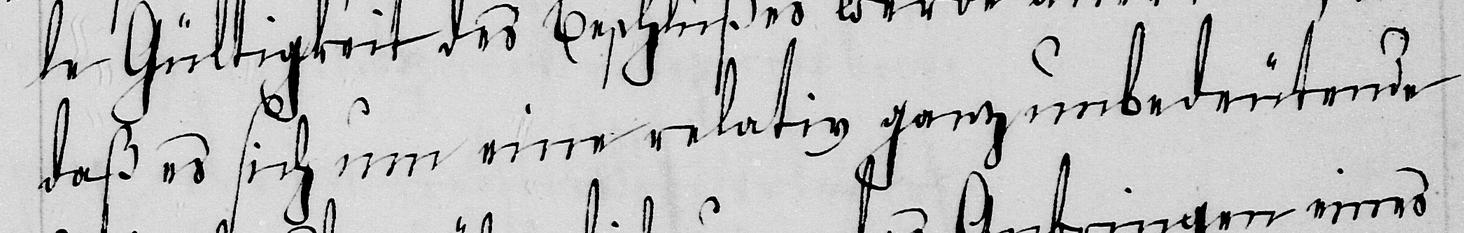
daß es sich um eine relativ ganz unbedeutende
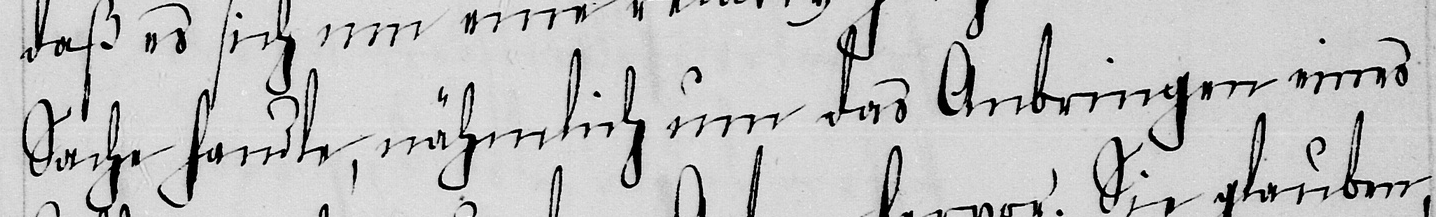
Sache handle, nähmlich um das Anbringen eines
